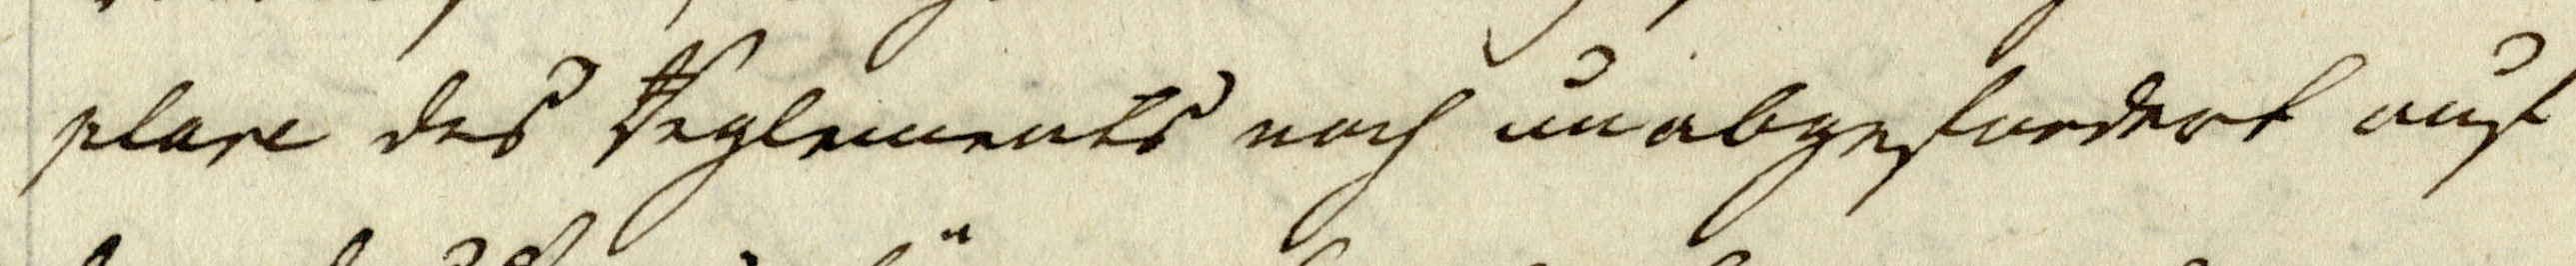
plare des Reglements noch unabgefordert auf
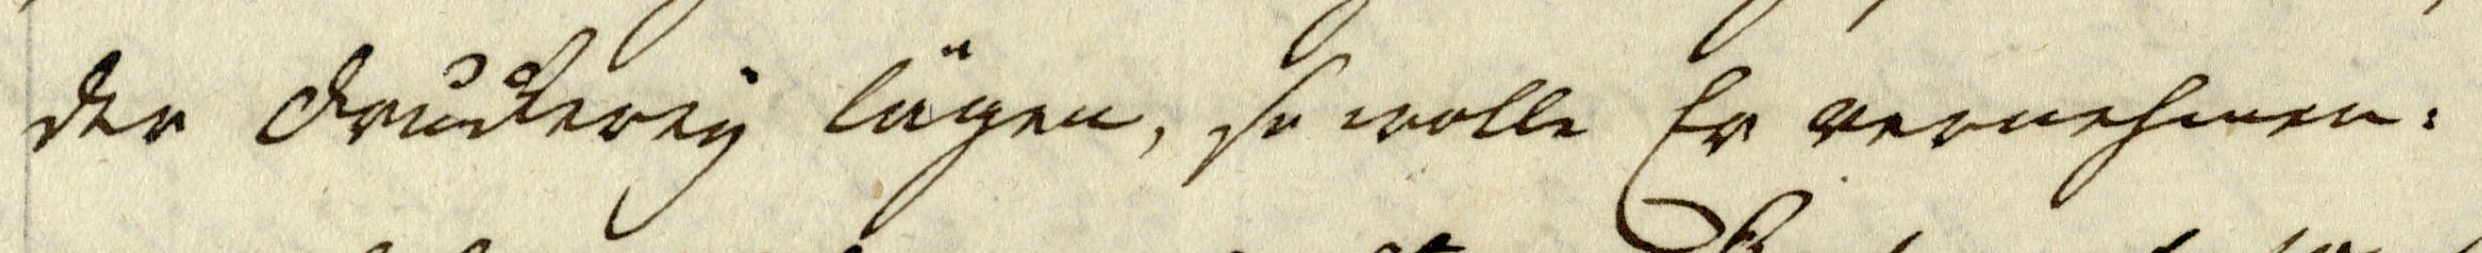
der Druckereÿ lägen, so wolle Er vernehmen:
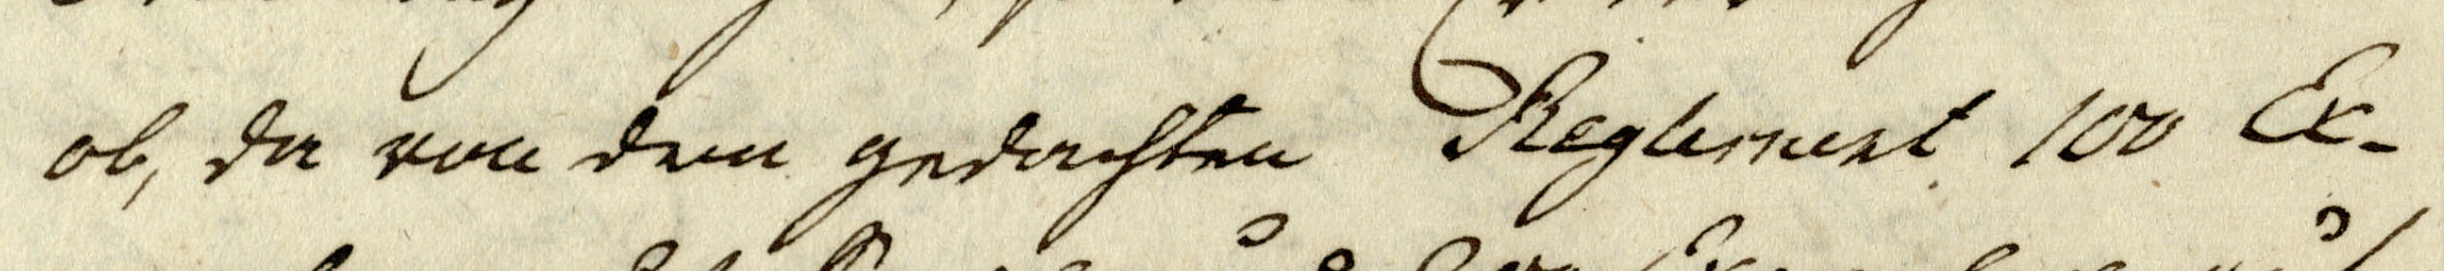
ob, da von dem gedachten Reglement 100 Ex¬
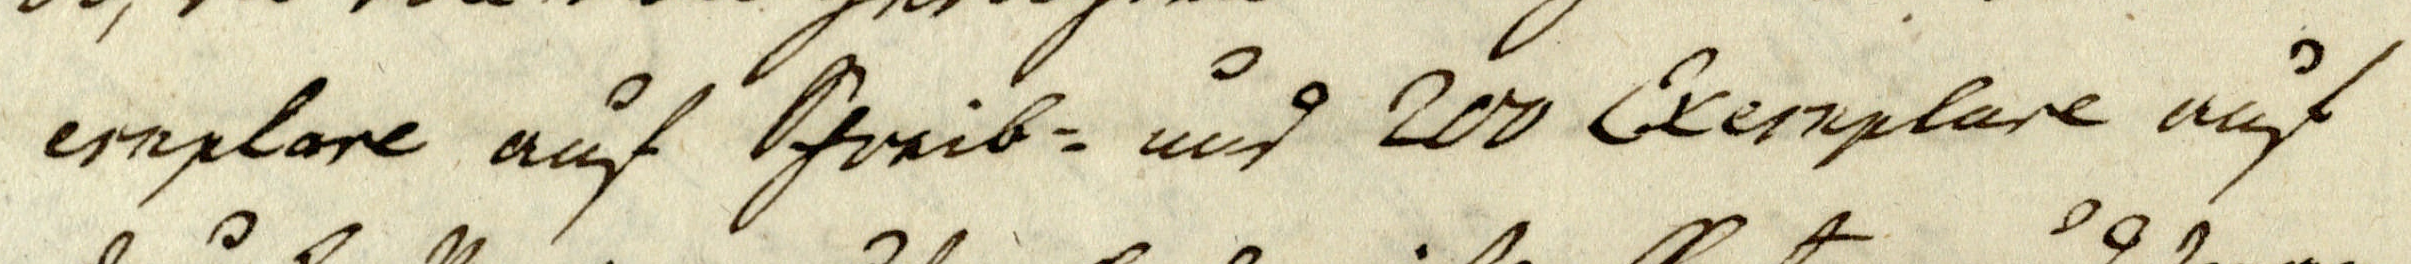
emplare auf Schreib- und 200 Exemplare auf
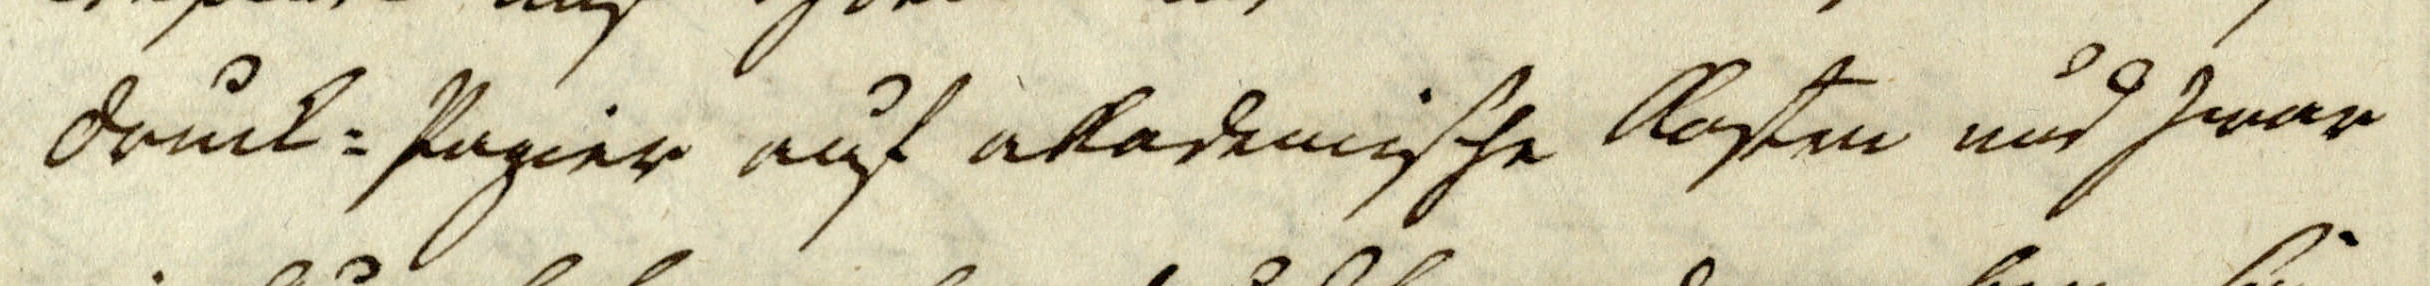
Druck- Papier auf akademische Kosten und zwar
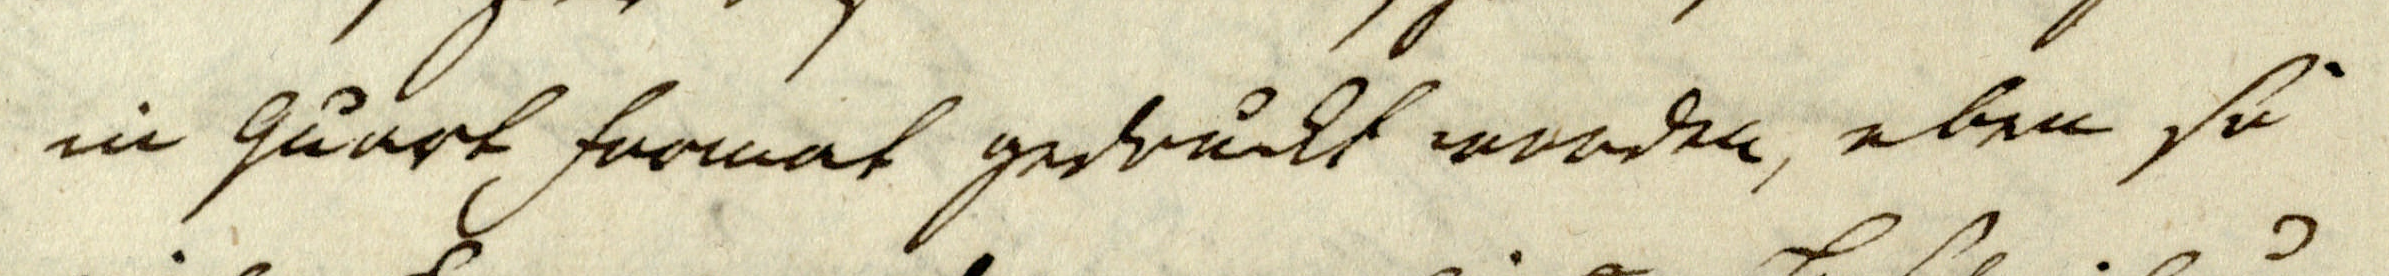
in Quart Format gedruckt worden, eben so
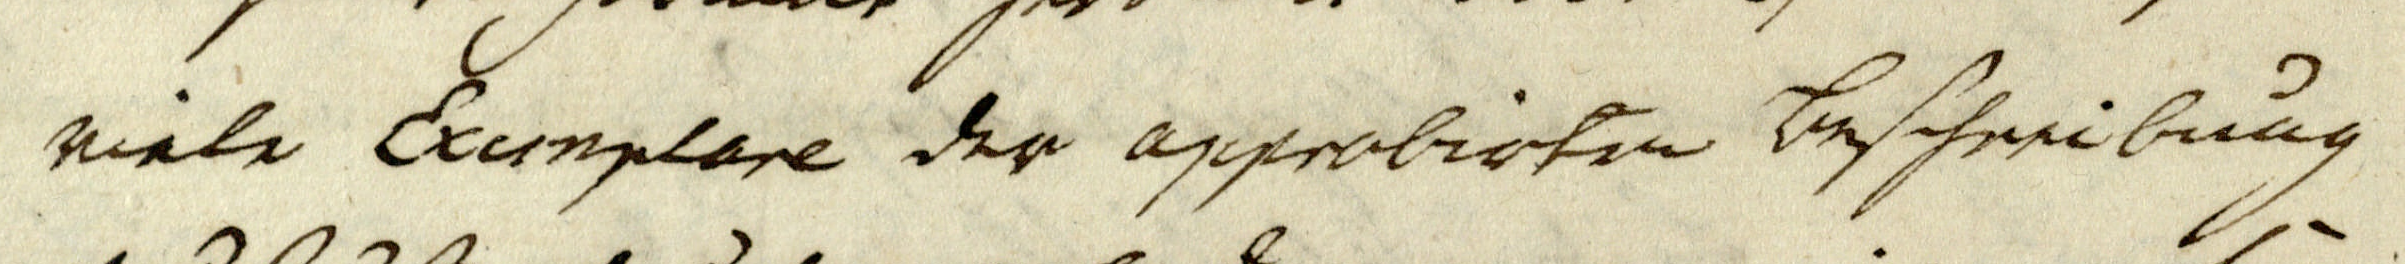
viele Exemplare der approbirten Beschreibung
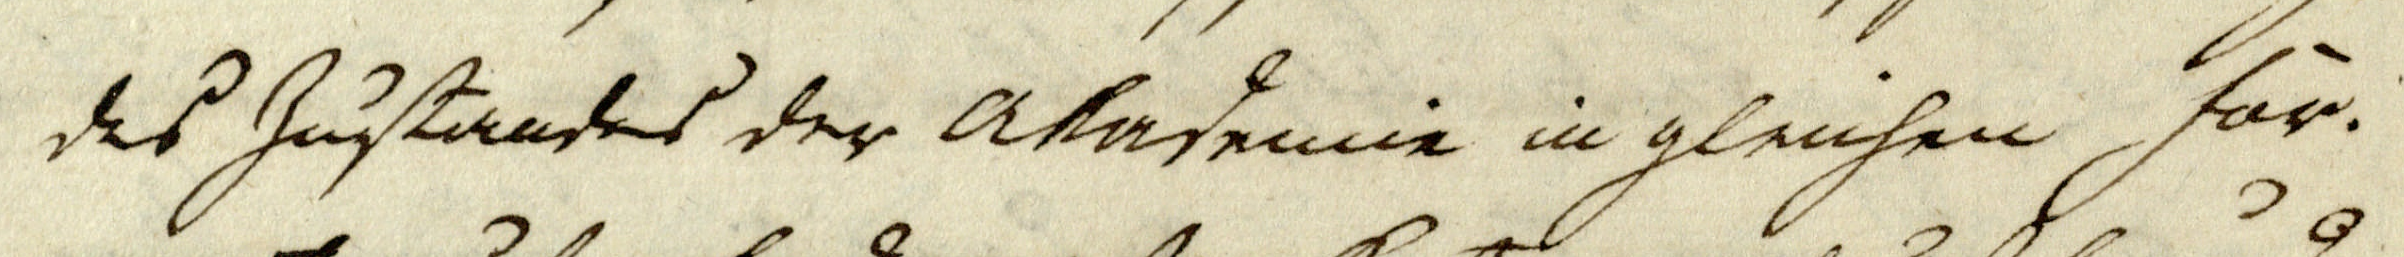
des Zustandes der Akademie in gleichen For¬
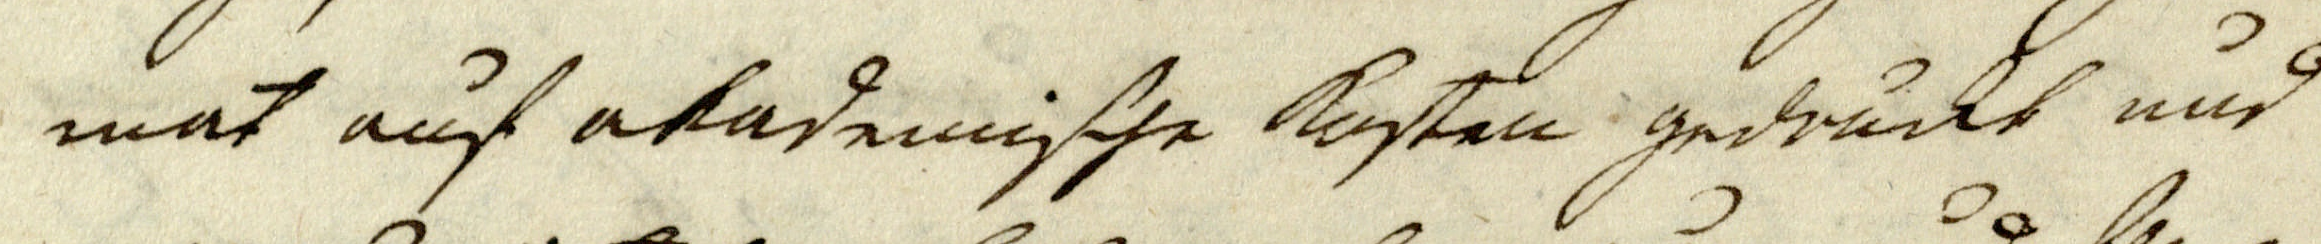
mat auf akademische Kosten gedruckt und
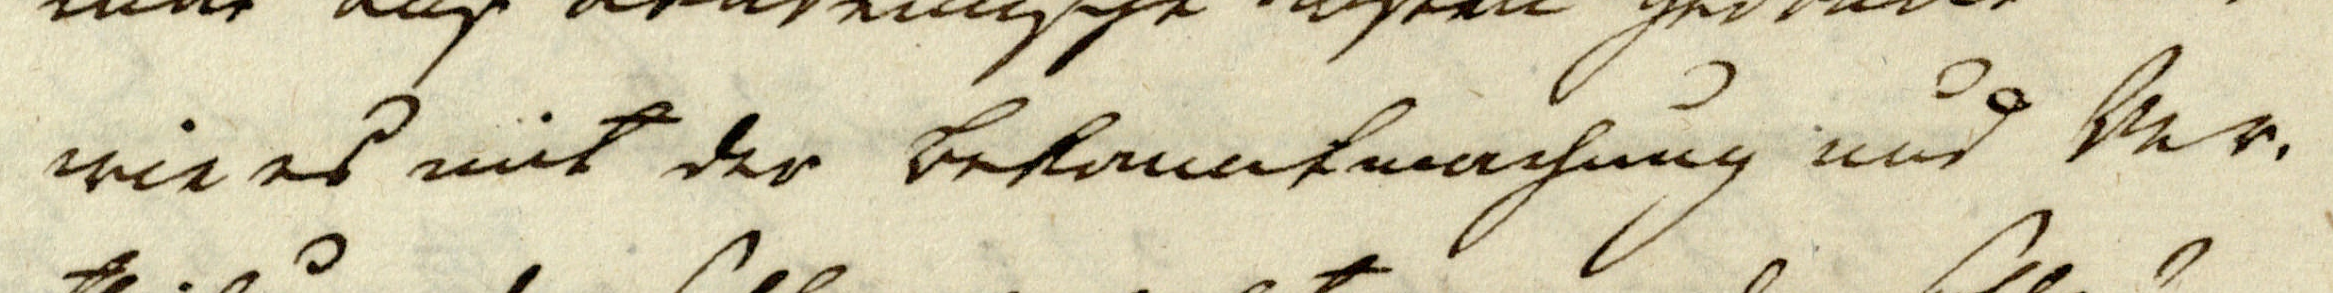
wie es mit der Bekanntmachung und Ver¬
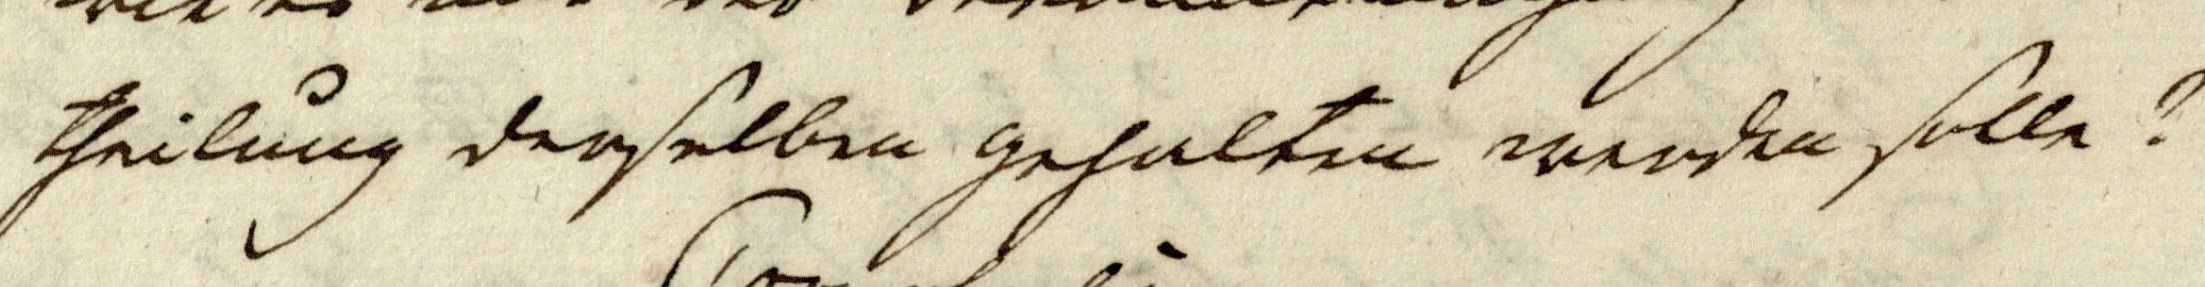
theilung derselben gehalten werden solle?
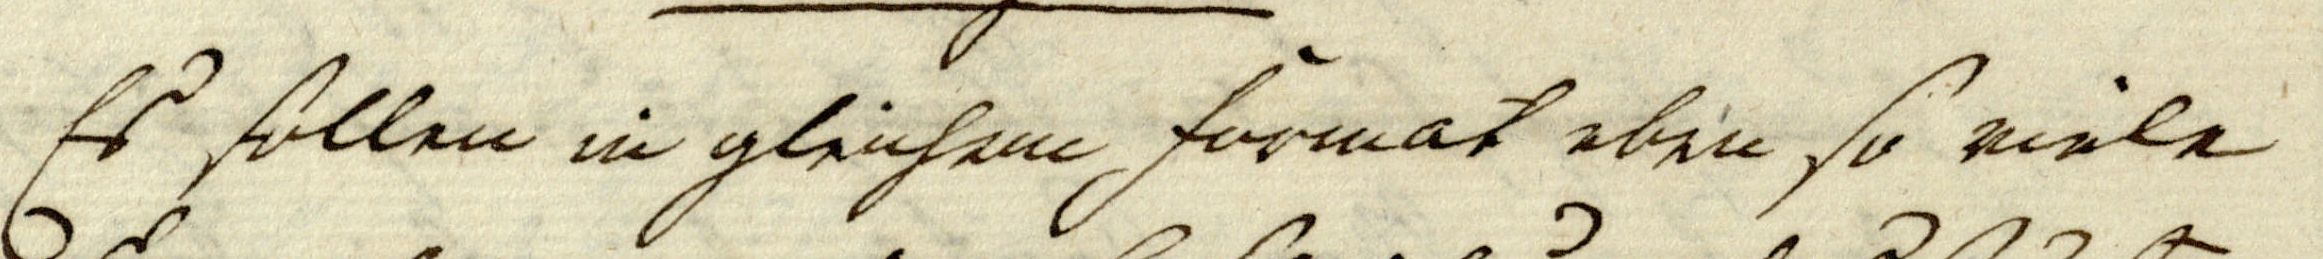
Es sollen in gleichem Format eben so viele
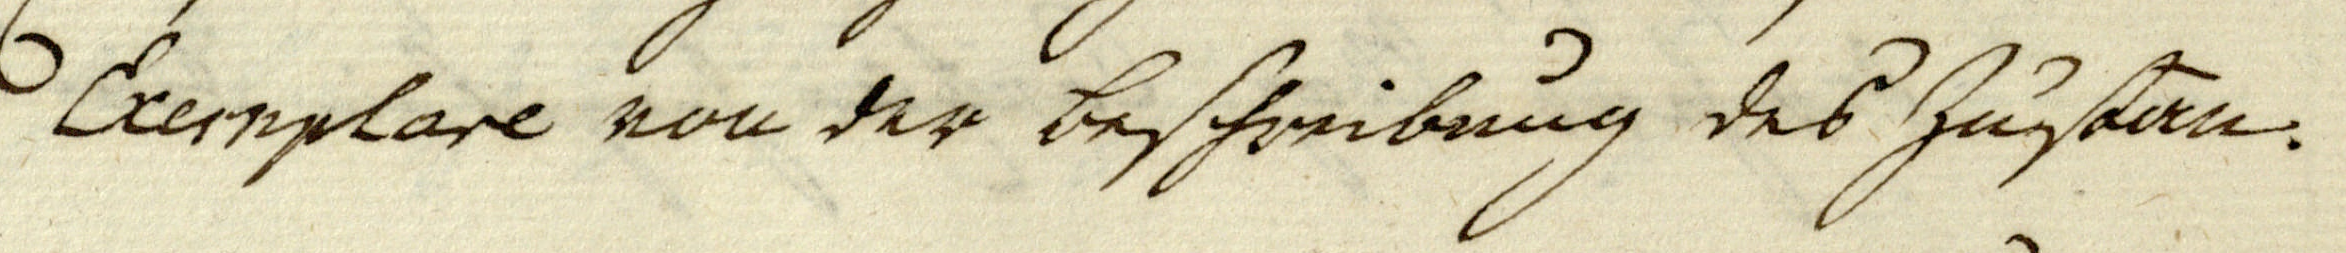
Exemplare von der Beschreibung des Zustan¬
